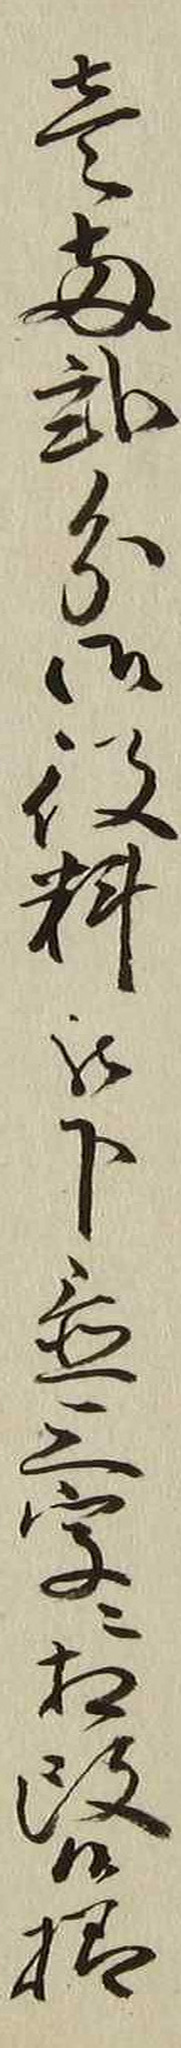壱両弐分御役料被下置三字ニ相改候様
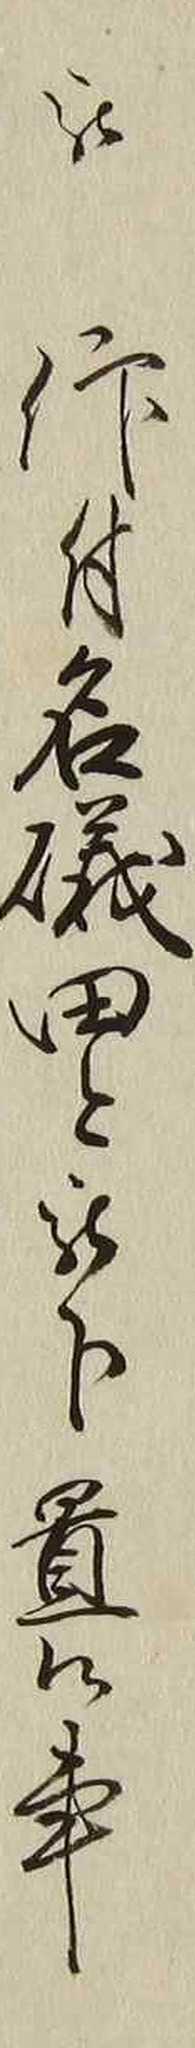被仰付名磯田と被下置侯事
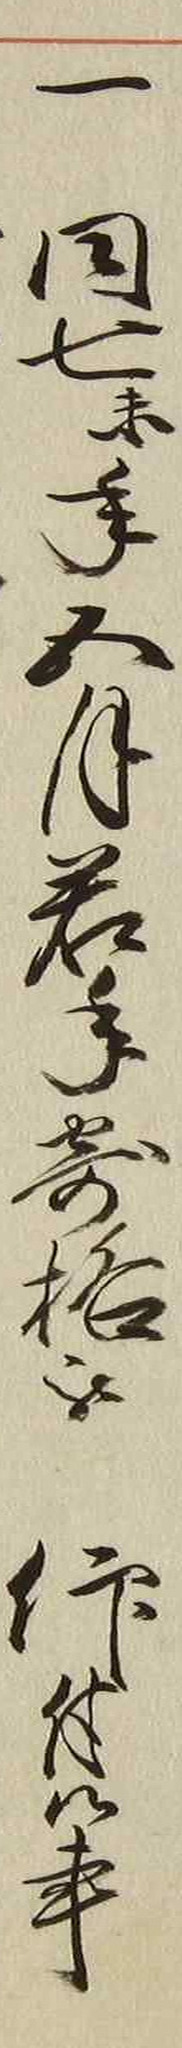一同七未年五月若年寄格被仰付候事
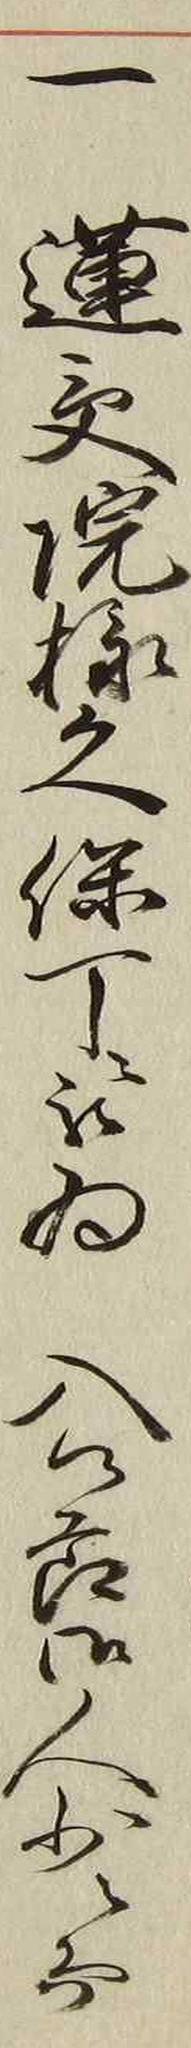一蓮受院様久保丁ニ被為入候節御人少ニ而
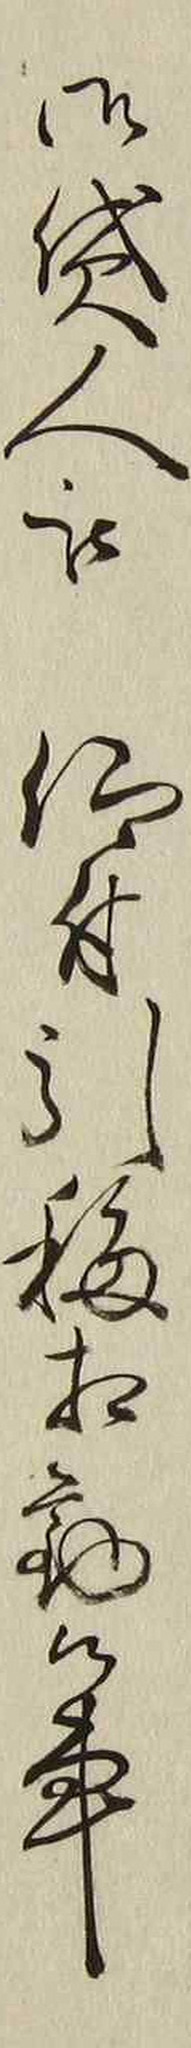御貸人被仰付引移相勤候事
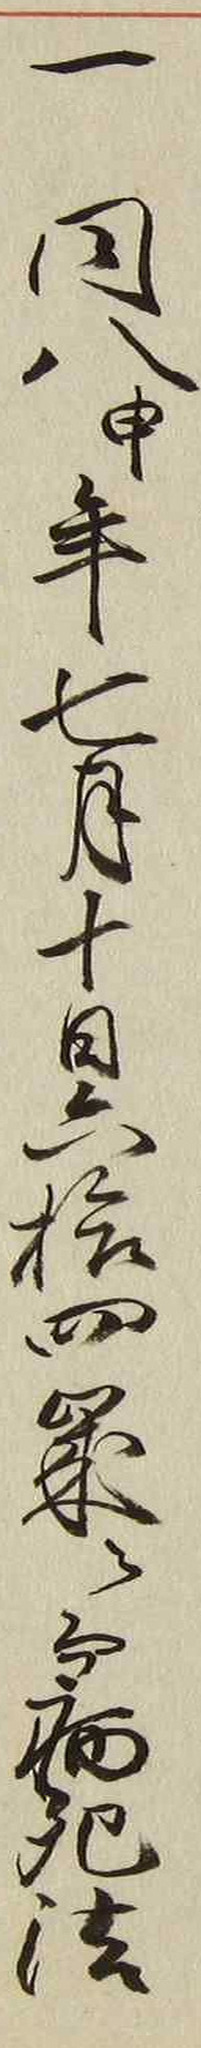一同八申年七月十日六拾四歳ニ而病死法
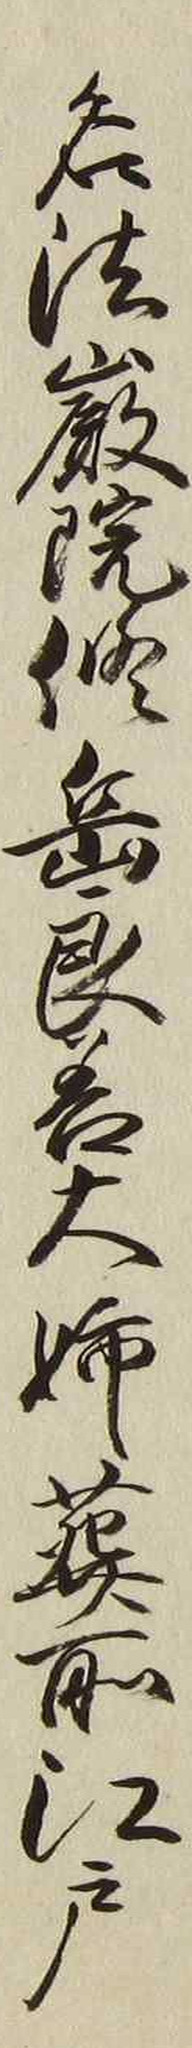名法厳院修岳良善大姉葬所江戸
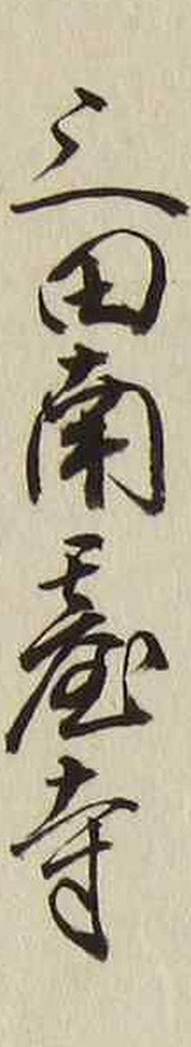三田南台寺
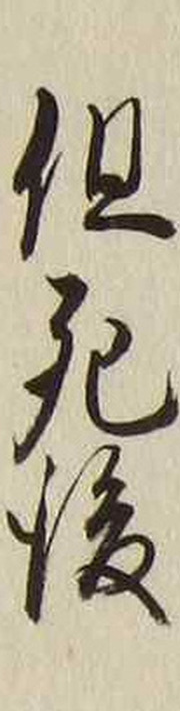但死後
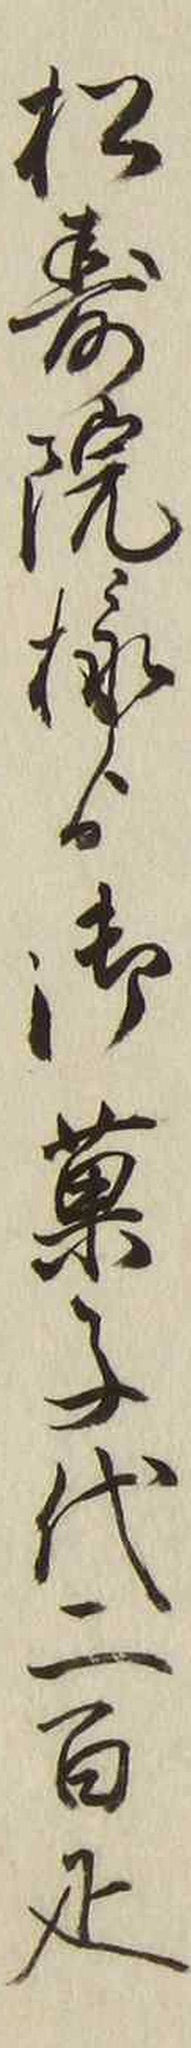松寿院様ゟ御菓子代二百疋

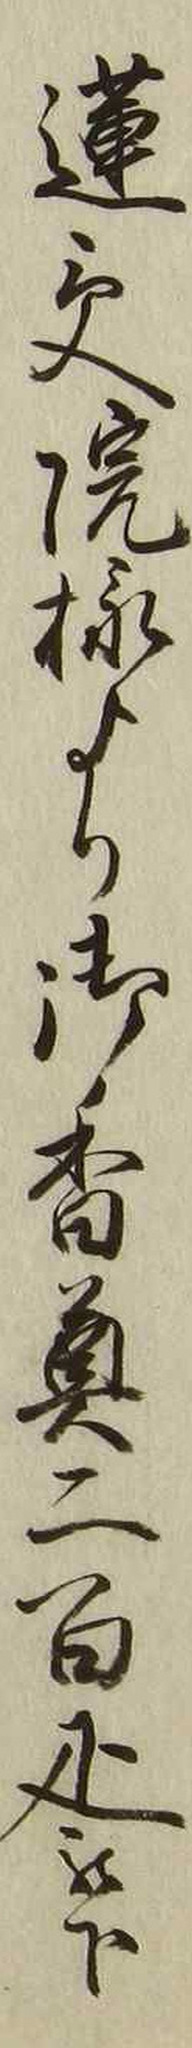蓮受院様より御香奠二百疋被下
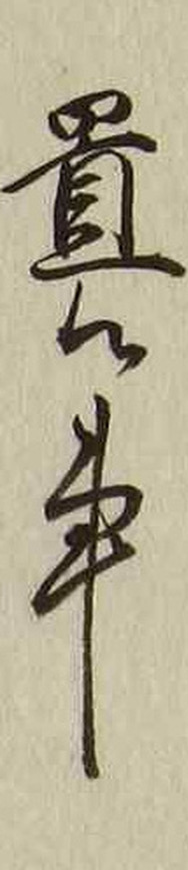置候事
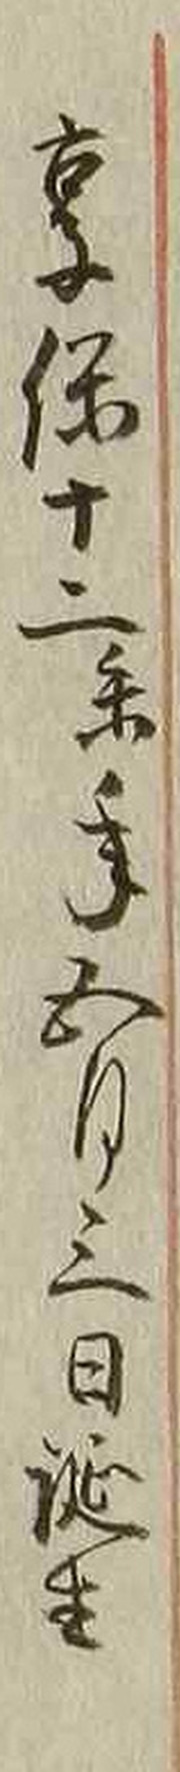享保十二未年五月三日涎生
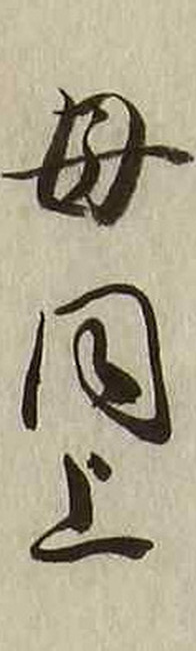母同上
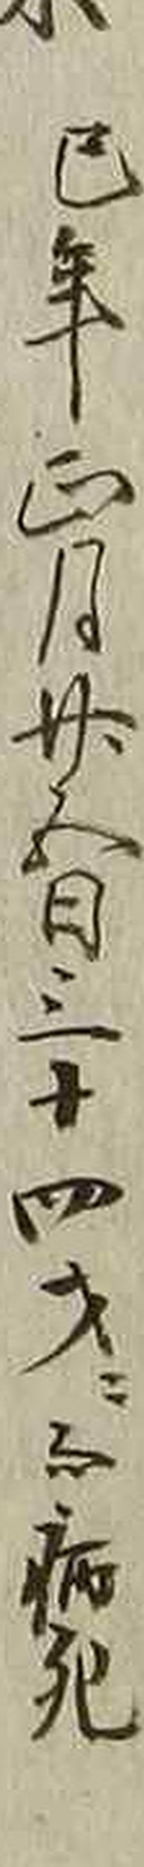巳年正月廿五日三十四才ニ而病死
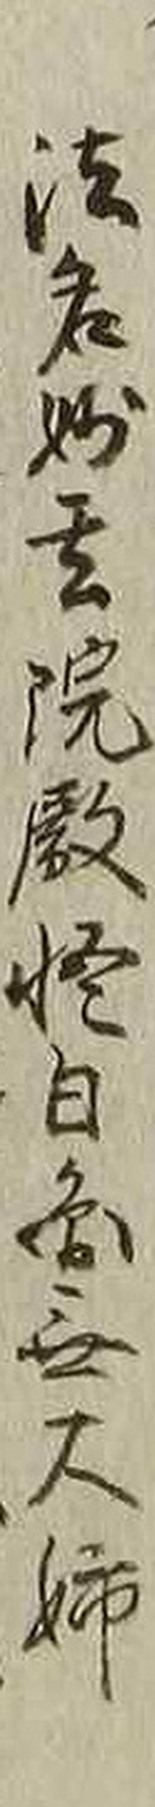法名妙玄院殿軽日円無大姉
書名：諸士系譜　巻之21　い之部21
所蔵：会津若松市立会津図書館
